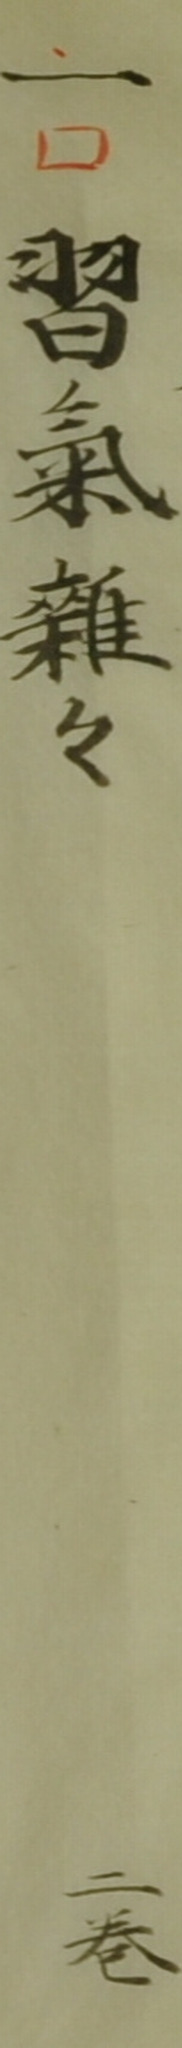一習氣雑々ニ巻
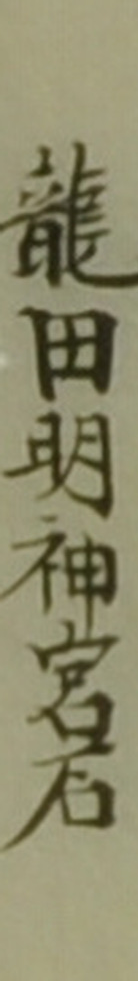龍田明神宮石
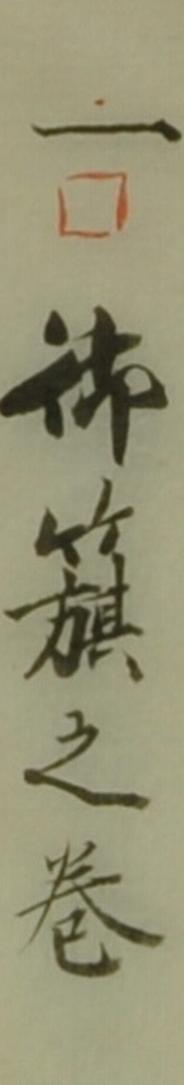一武器之巻
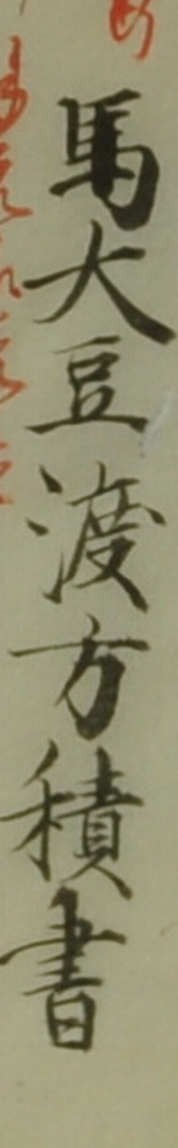馬大豆渡方積書
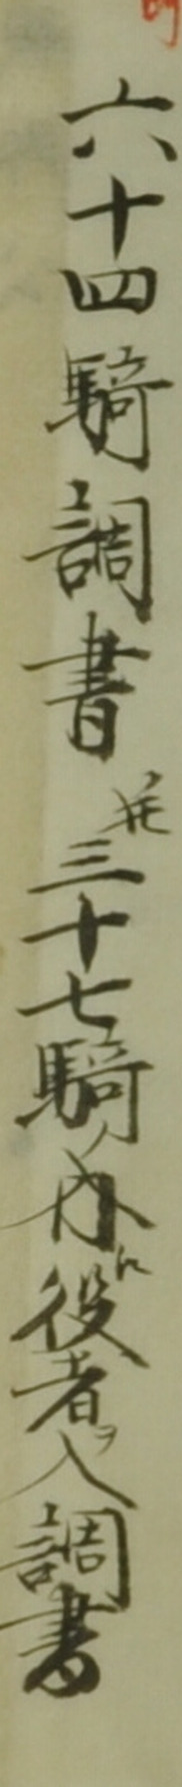六十四騎調書并三十七騎役者を入調書

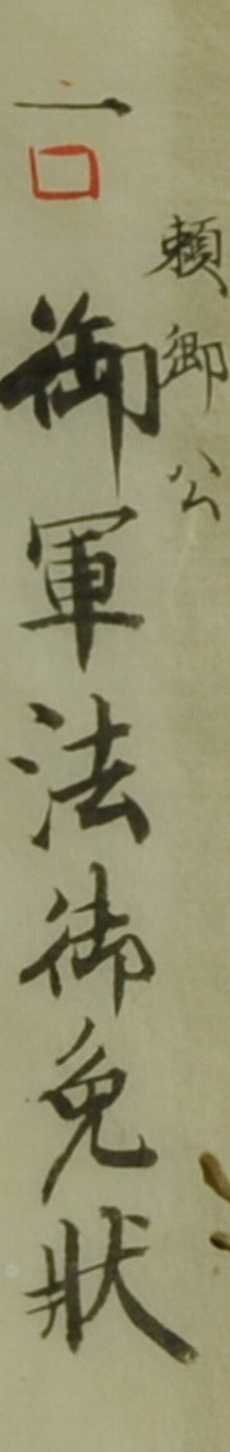一御軍法御免状
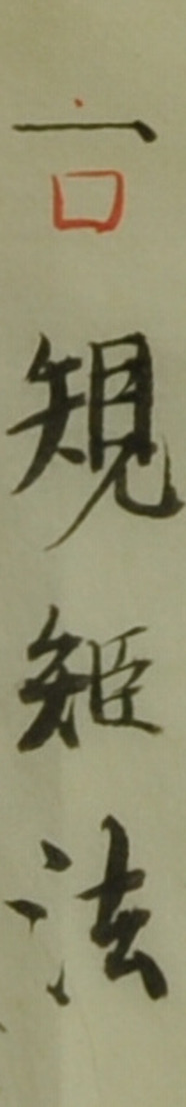一規矩法
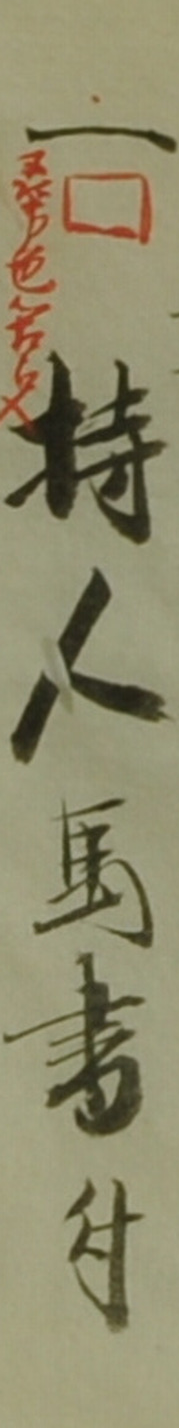一持人馬書付
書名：御直筆御書付類調帳
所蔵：伊那市立高遠町図書館・合同会社AMANE
